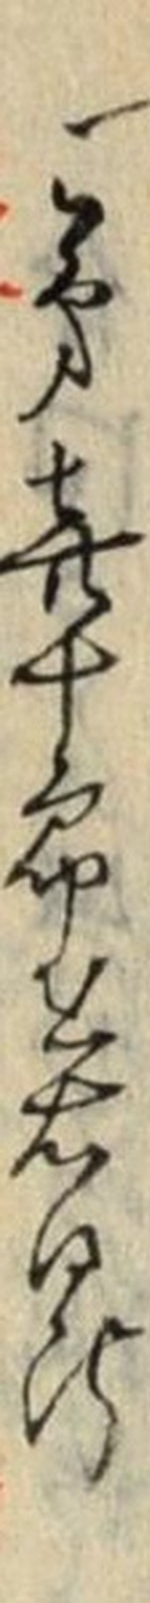弟喜十郎を右同断
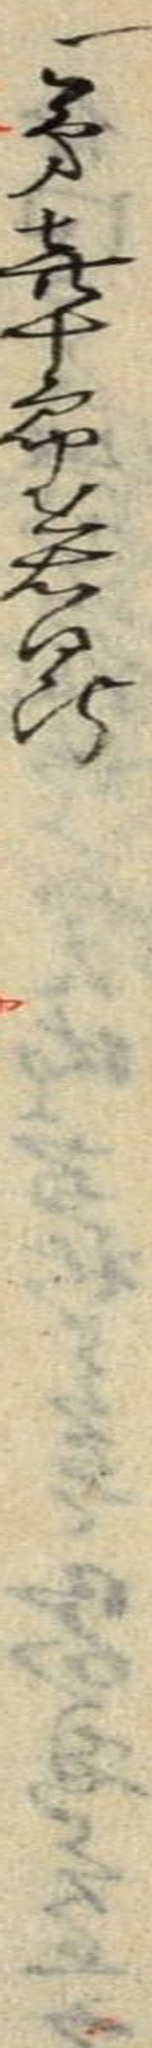弟喜十郎を右同断
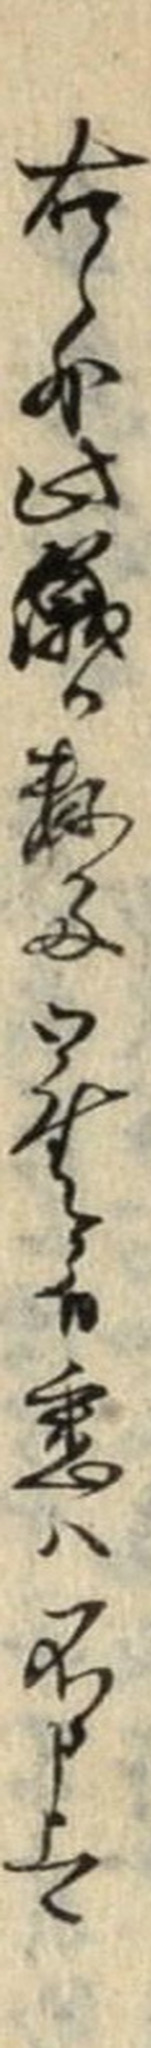右之外此ハ数多御座候ニ付悉ハ不申上候
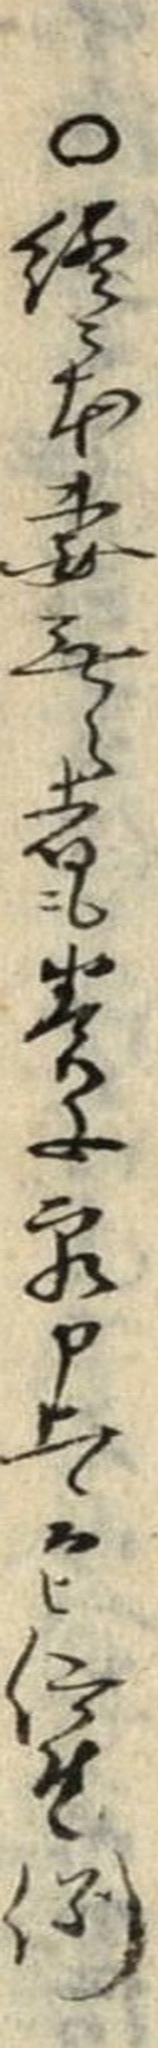〇終ニ本妻無之者も養子願申上候而被仰付候例
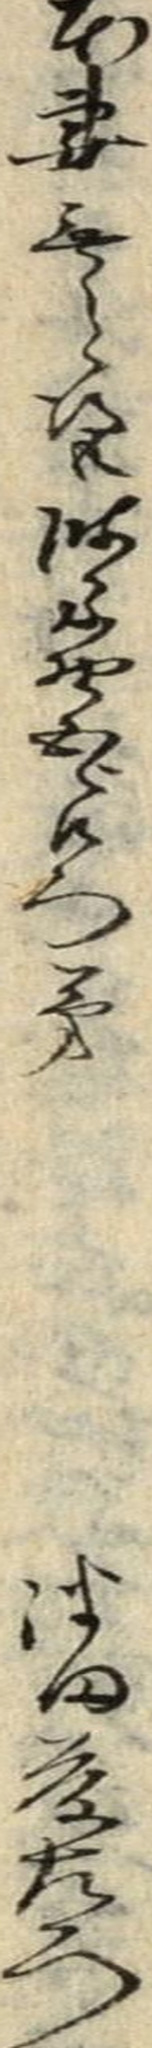本妻無之候得共波多野五郎左衛門弟津田藤左衛門
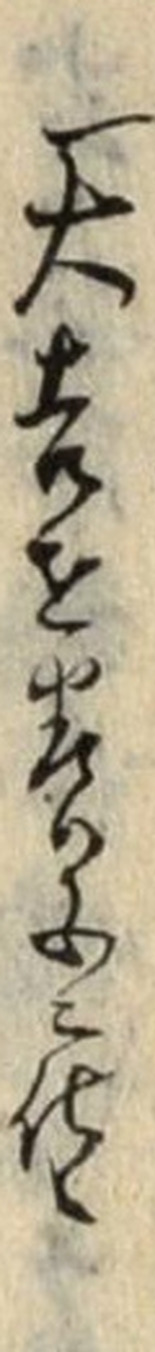大吉を養子ニ仕候
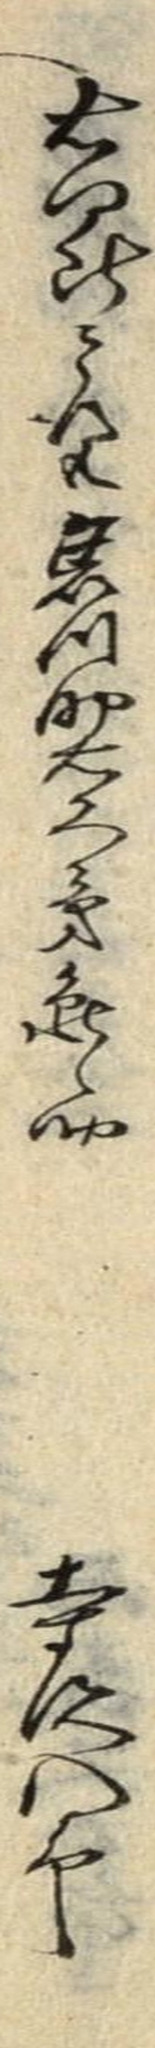右同断ニ候得共荒川助右衛門弟亀之助寺沢八郎
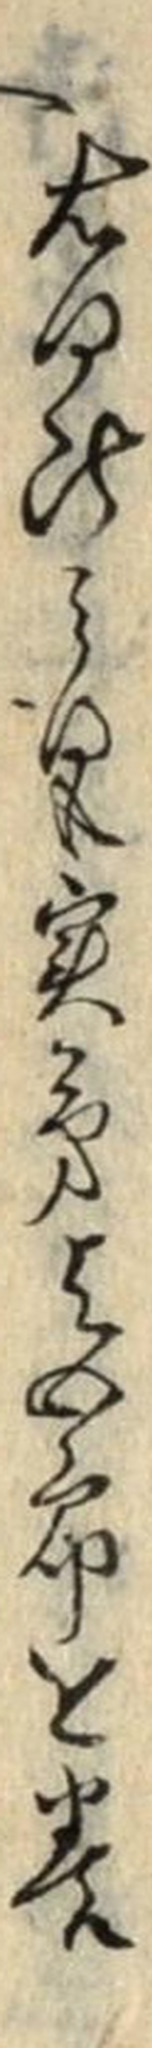右同段ニ候得共実弟与五郎を養

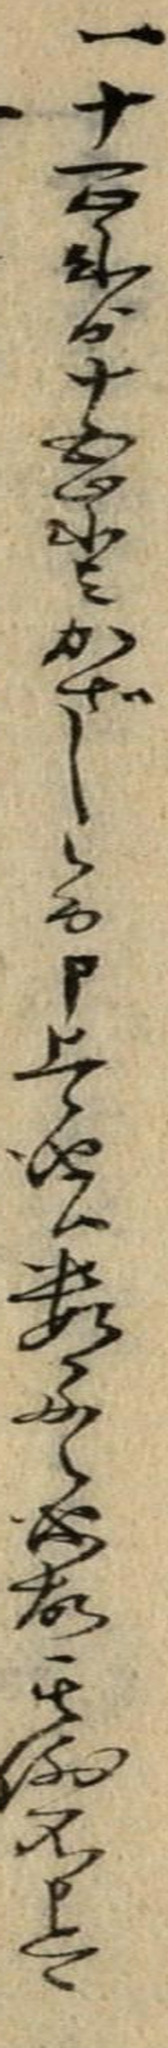一十一歳ゟ十五歳をかざし候而申上候儀ハ数多之儀故其例不申上候
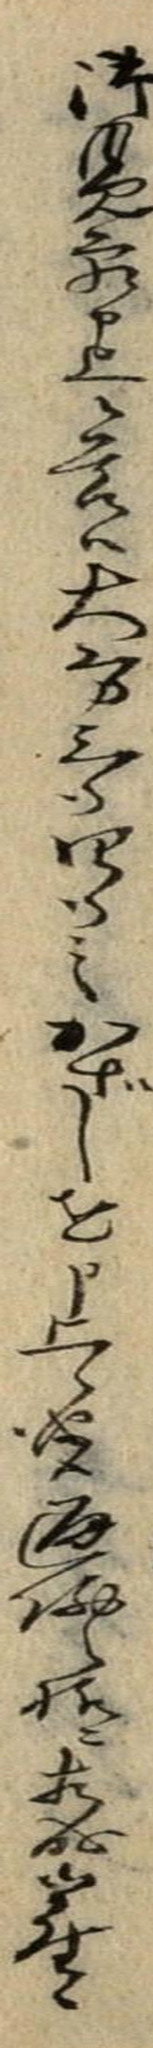御目見願申上候節ハ大方三ツ四ツ之かざしを申上候儀ハ通例之様ニ相成御座候
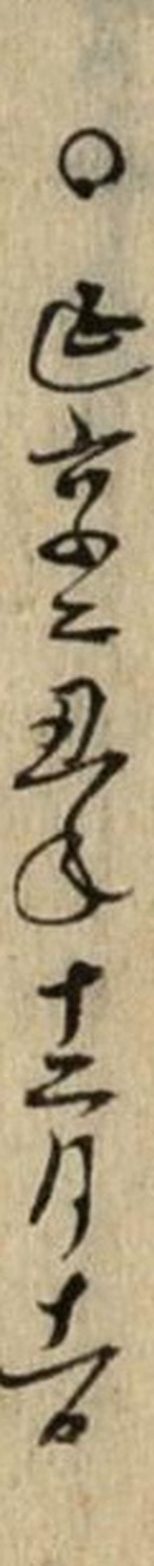〇延享ニ丑年十二月十一日
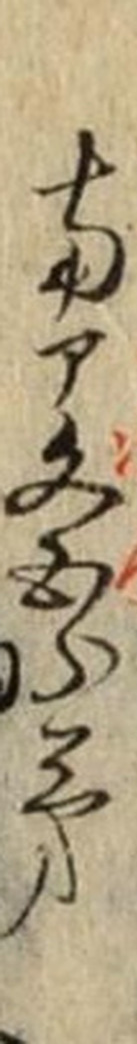南部文五郎弟
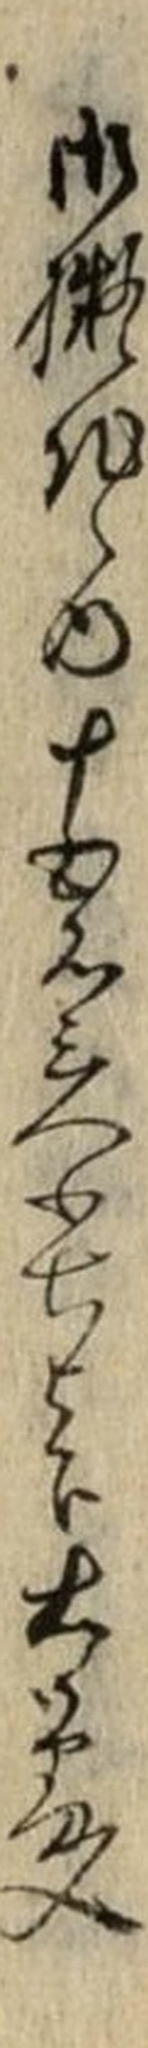御擬作之内十五石三人ふち被下大御番入
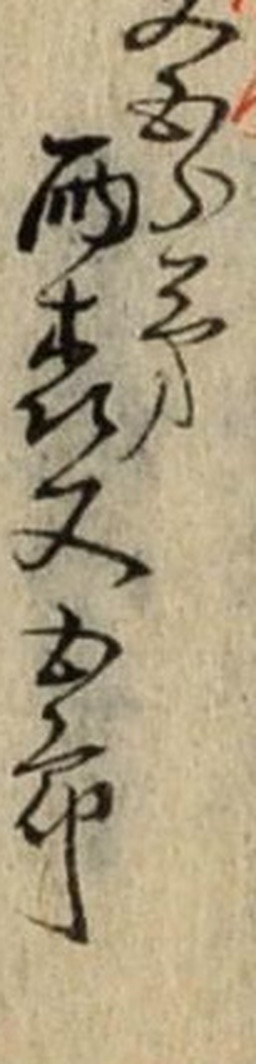雨森又五郎
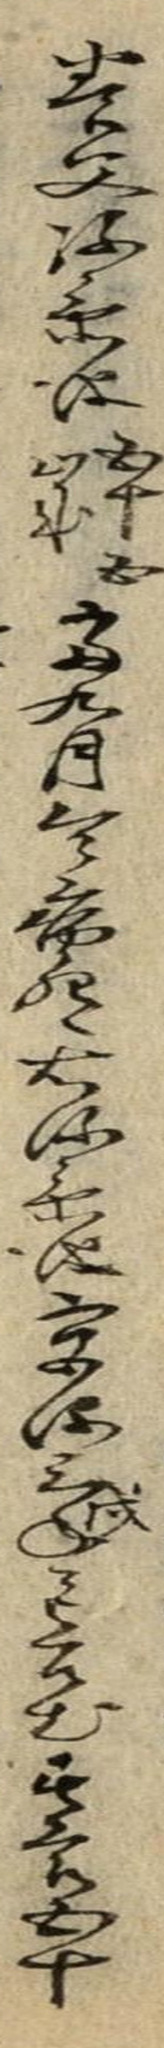養父弥兵衛儀五十五歳当九月令病死候右弥兵衛儀享保三戌年ニ被召出其節五十
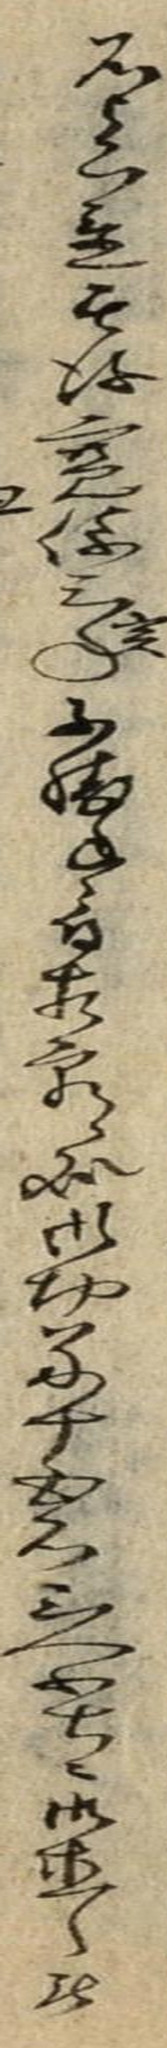石被下置其後寛保三亥年不勝手ニ付相願候処御切米十五石三人ふちニ御直し被
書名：養子縁組之部
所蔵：福井県文書館 Fukui Prefectural Archives
